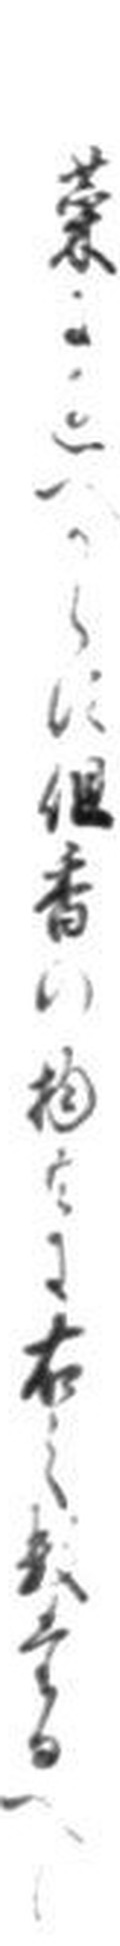菜に過へからす但香の物共に右之数たるへし
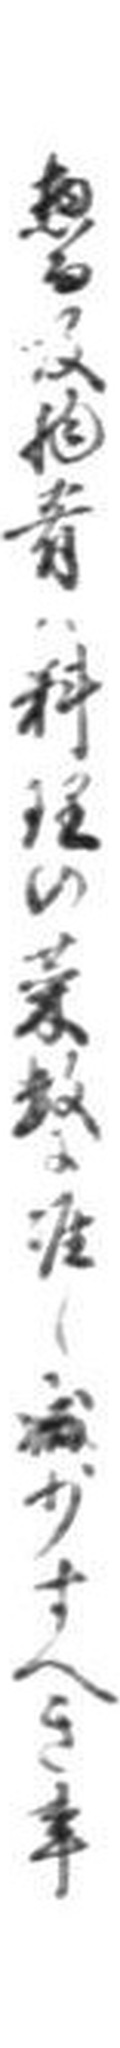惣而吸物肴ハ料理之菜数に准し減少すへき事
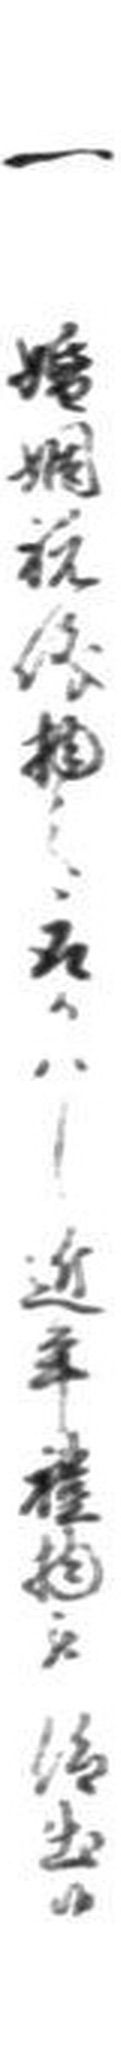一婚姻祝儀物之取かハし近年礼物被仰出候
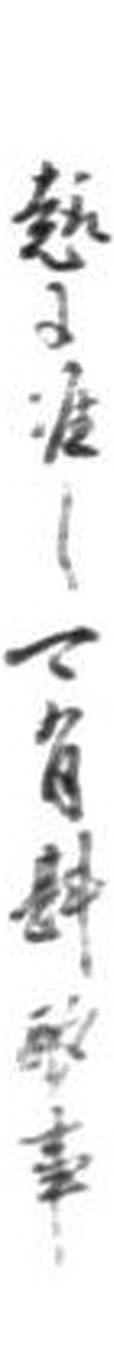趣に准し可有斟酌事
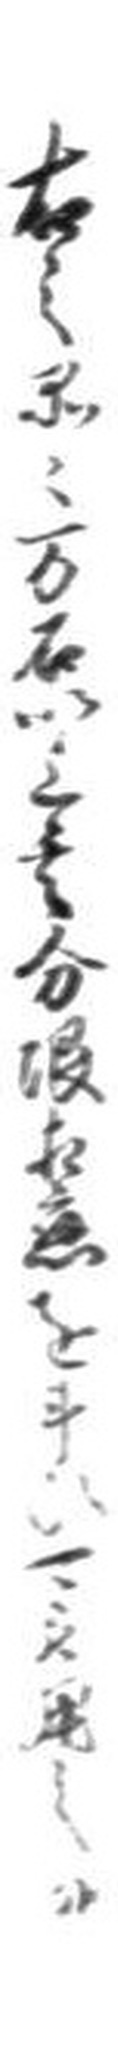右之品々万石以上其分限相応を計ひ可取用之候
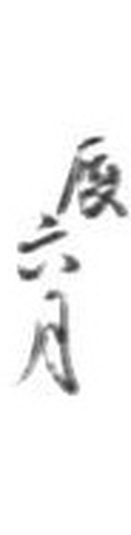辰六月
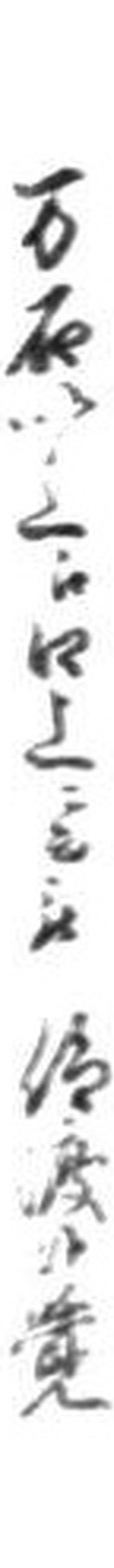万石以上江口上ニ而被仰渡候覚
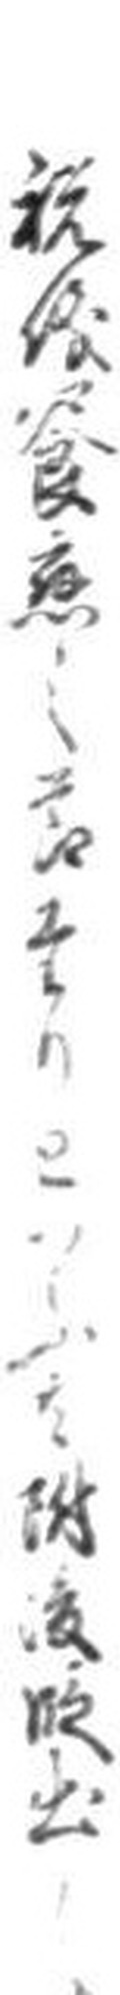祝儀饗応之節たりといふ共附後段出し候
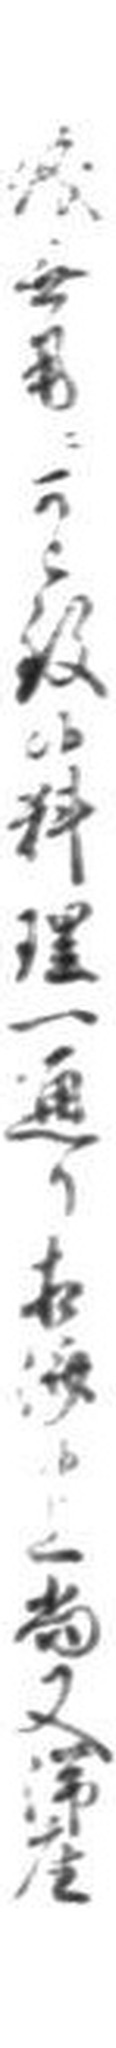儀無用ニ可被致候料理一通り相済候上尚又滞座

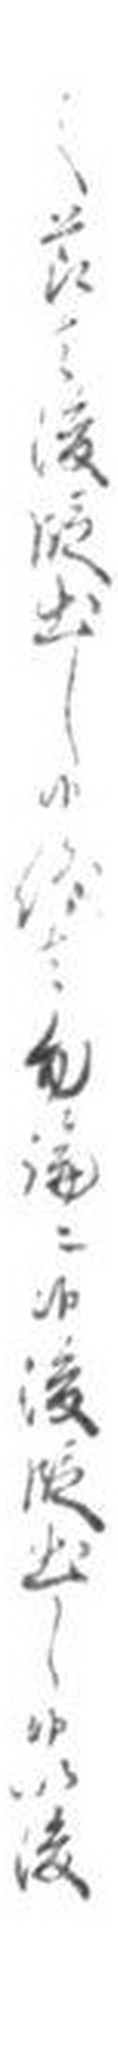之節者後段出し候儀者勿論ニ候後段出し候以後
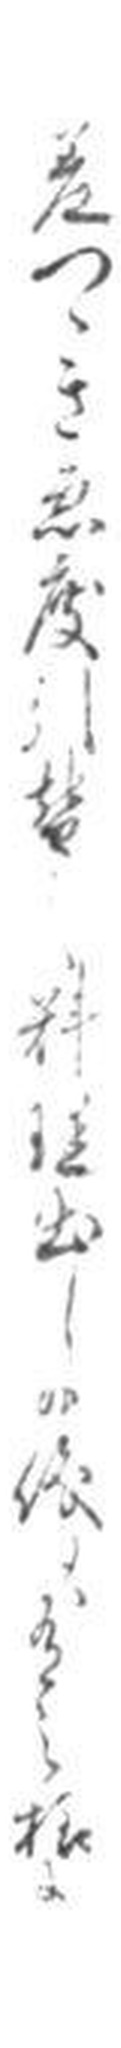差つゝき急度引替之料理出し候儀も有之様子
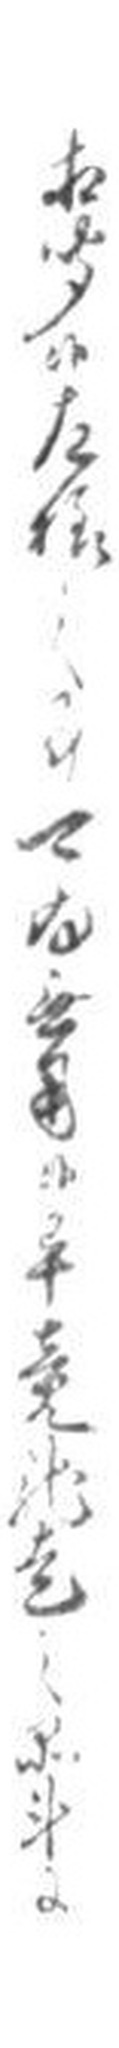相聞候左様之事可為無用候畢竟馳走之品斗に
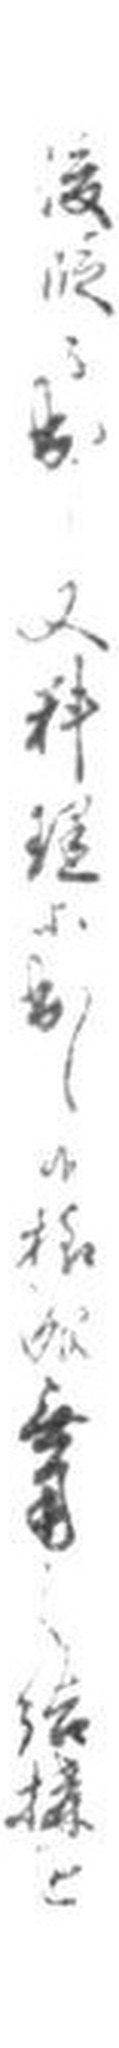後段も出又料理等出し候様成無用之結構を
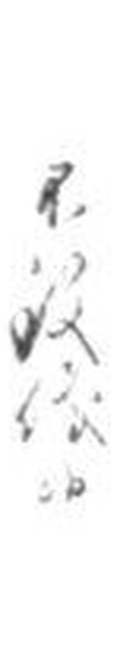不致儀候
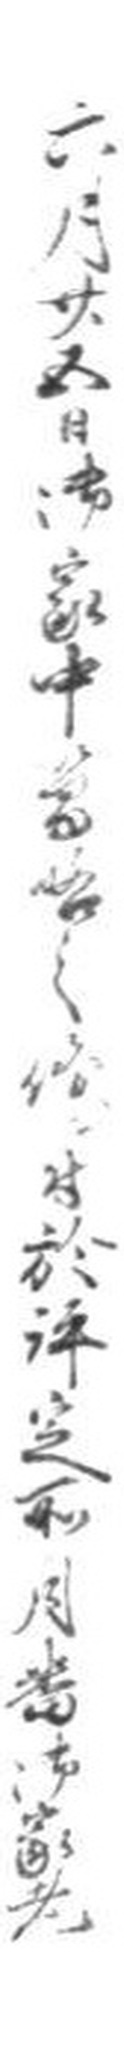一六月廿五日御家中簡略之儀ニ付於評定所月番御家老
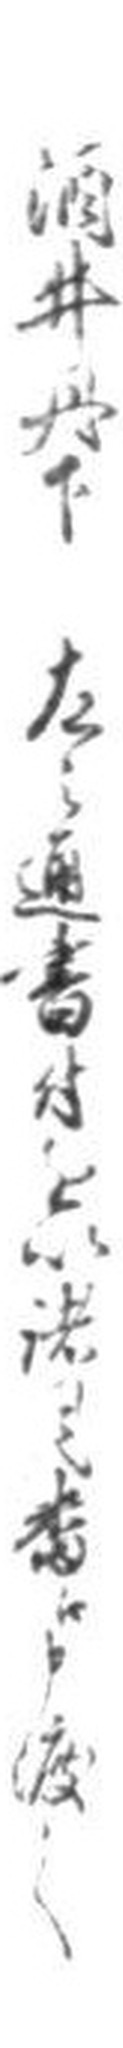酒井丹下左之通書付を以諸月番江申渡之
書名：家譜 三十八 宗矩公 従享保九年五月到享保九年十二月
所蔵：福井県文書館 Fukui Prefectural Archives
